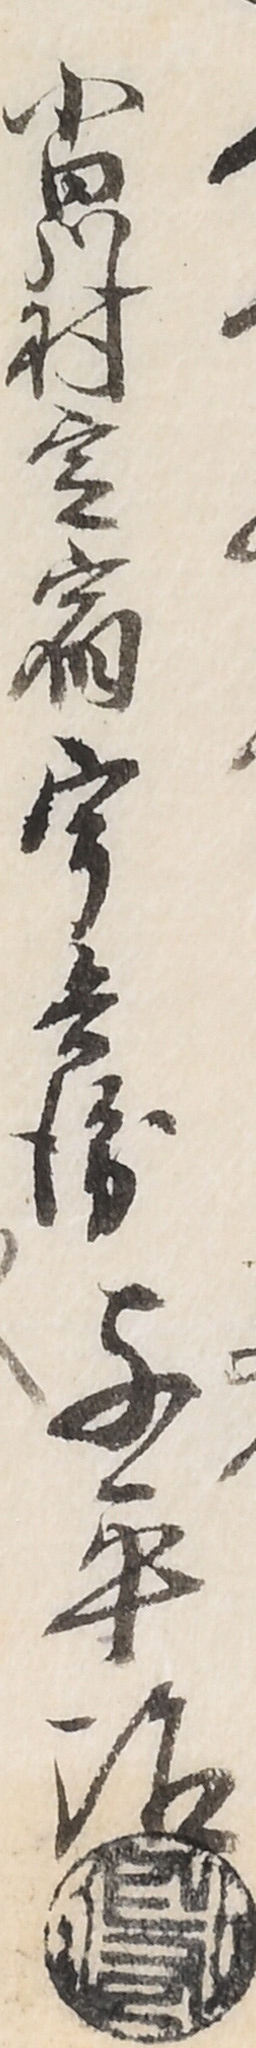小田川村定宿宇兵衛与平治(印)
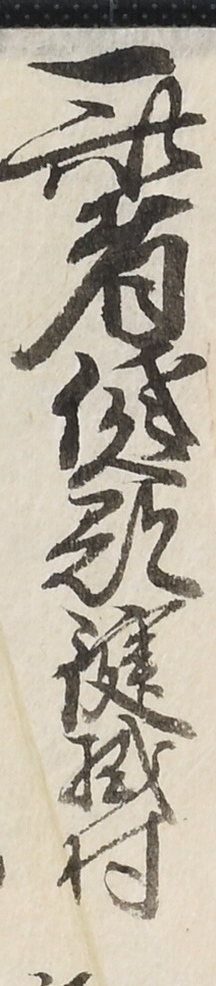一此者佐久郡鍵掛村
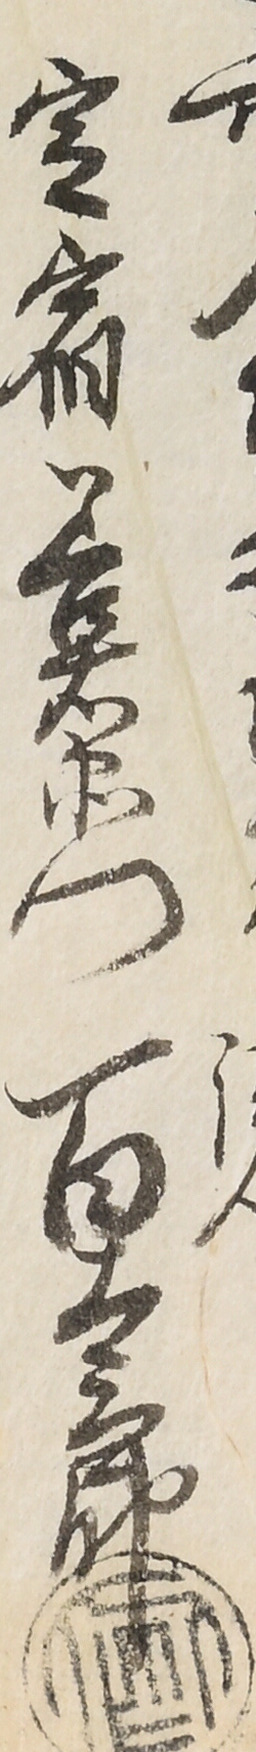定宿善右衛門百太郎(印)
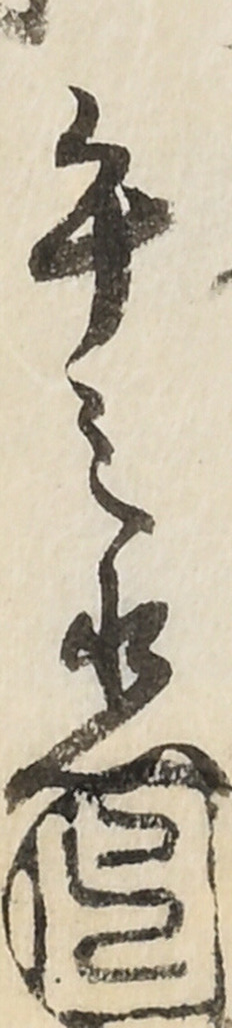午之丞(印)
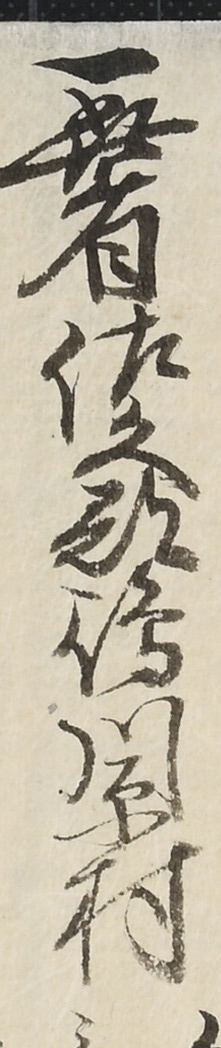一此者左久郡島川原村
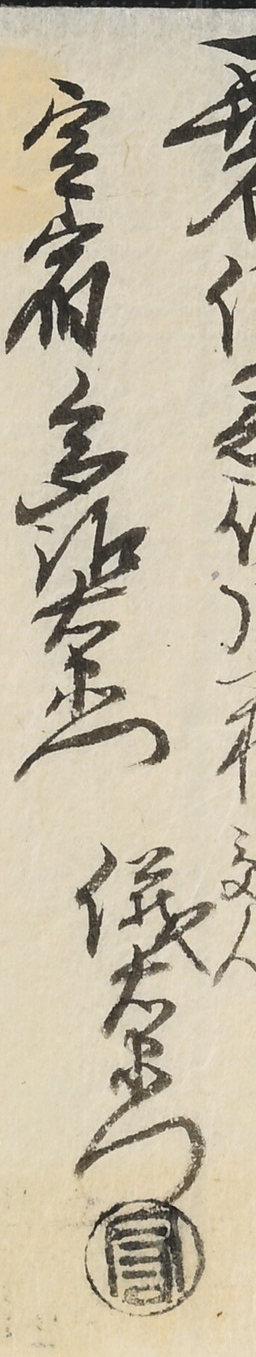定宿多治右衛門儀右衛門(印)

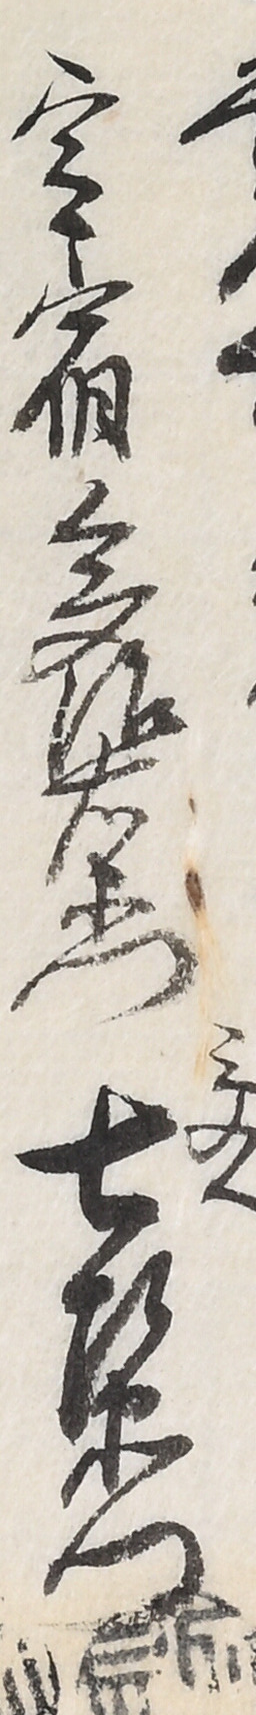定宿多治右衛門三左衛門㊞
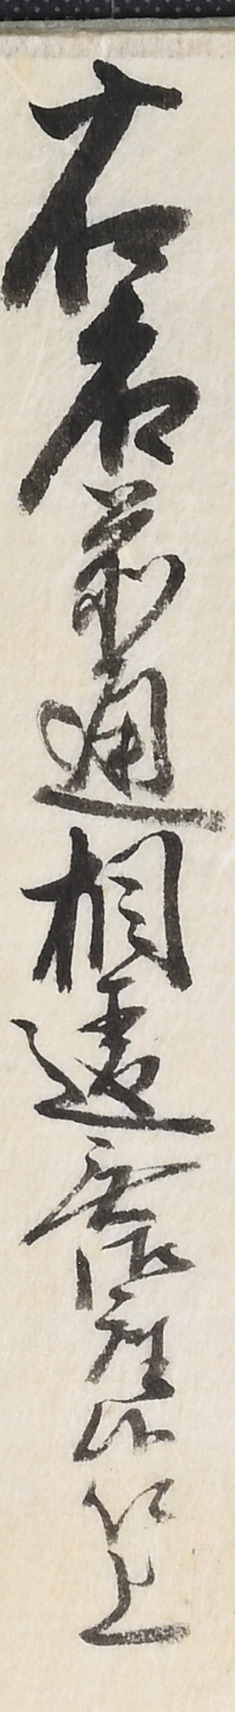右名前通相違無御座候以上
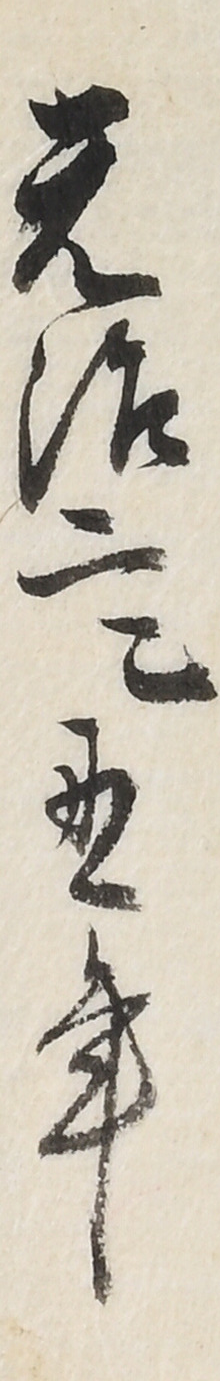元治二乙丑年
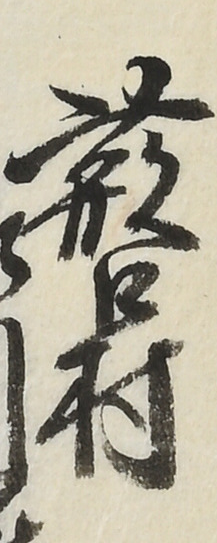荊口村
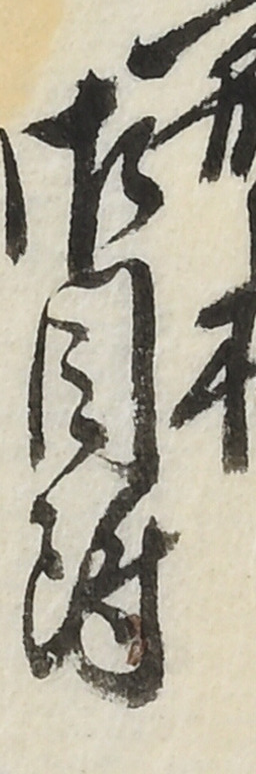御目附
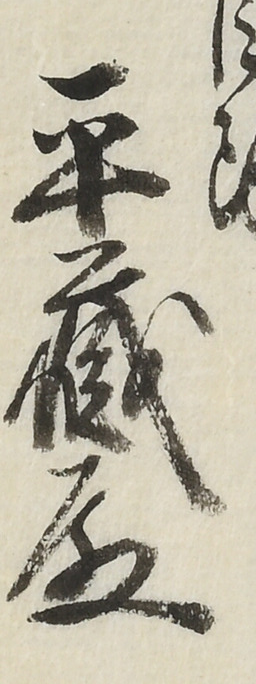平蔵殿
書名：元治二乙丑年二月他國石切名前書上帳
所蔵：伊那市立高遠町図書館・合同会社AMANE
